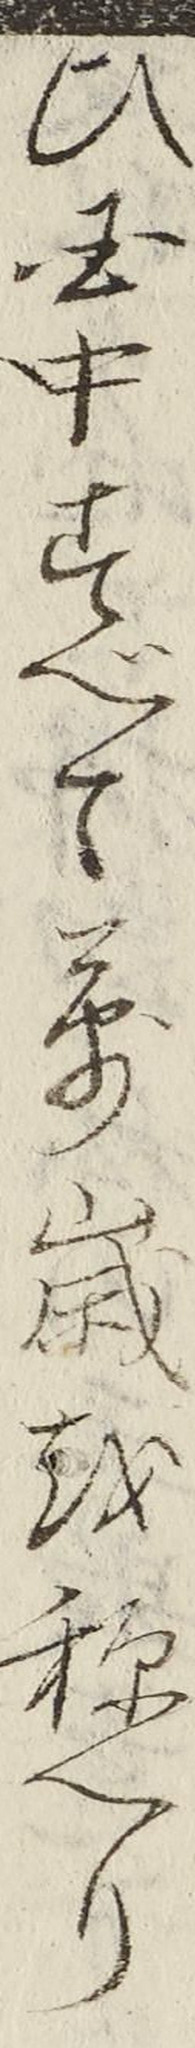ひ国中すべて万歳を称へり
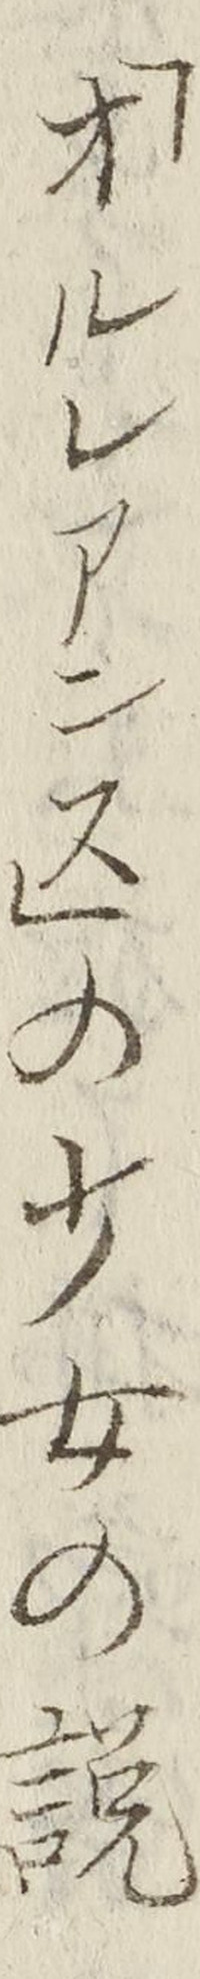「オルレアンス」の少女の説
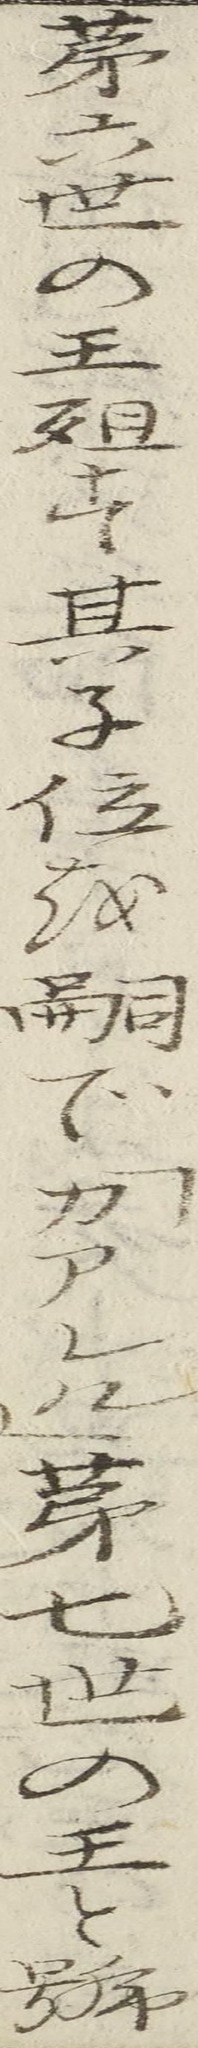第六世の王殂す其子位を嗣で「カアレル」第七世の王と号
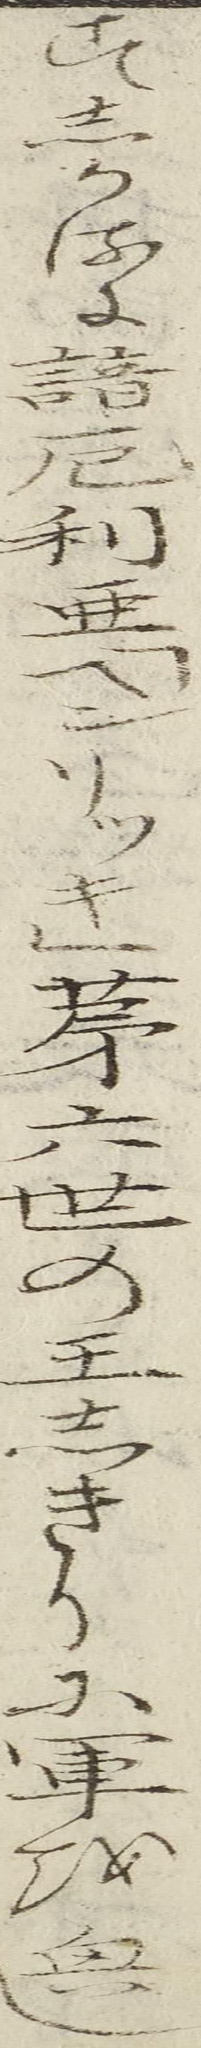すしかるに諳厄利亜「ヘンリッキ」第六世の王しきりに軍を興し

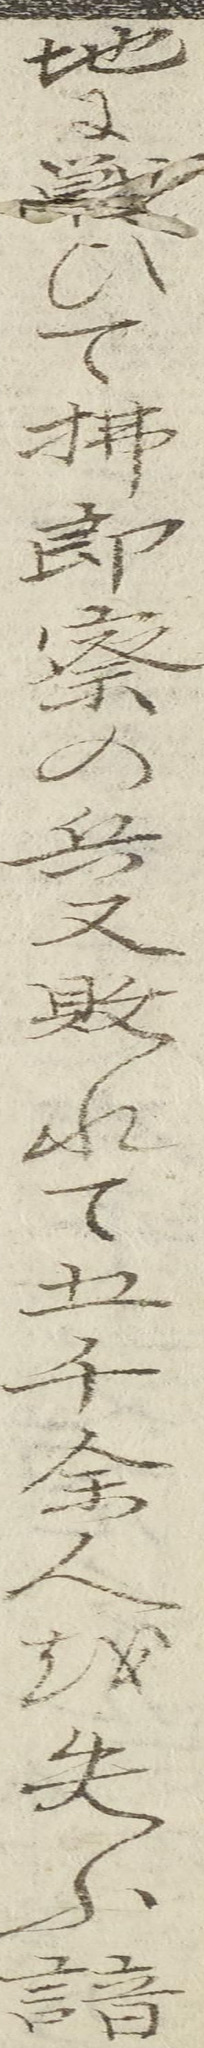地に戦ひて拂郎察の兵又敗れて五千余人を失ふ諳
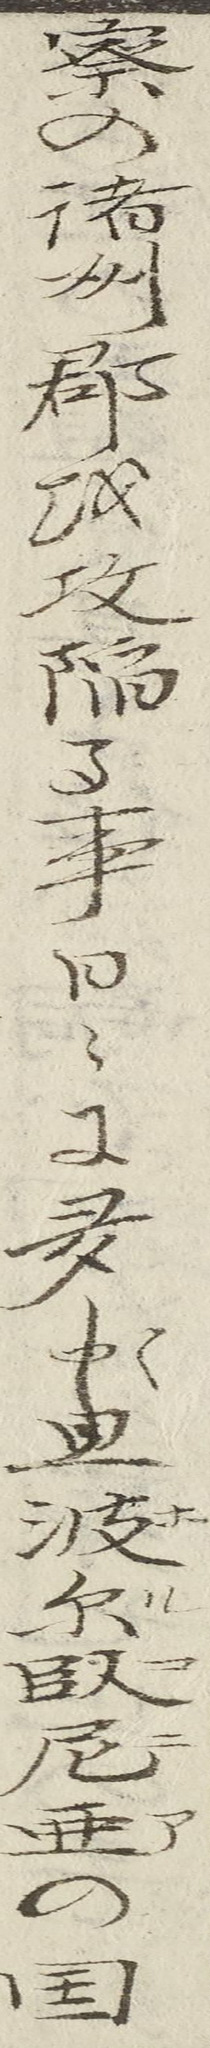察の諸州郡を攻陥る事日々に多く且波尓臥尼亜の国
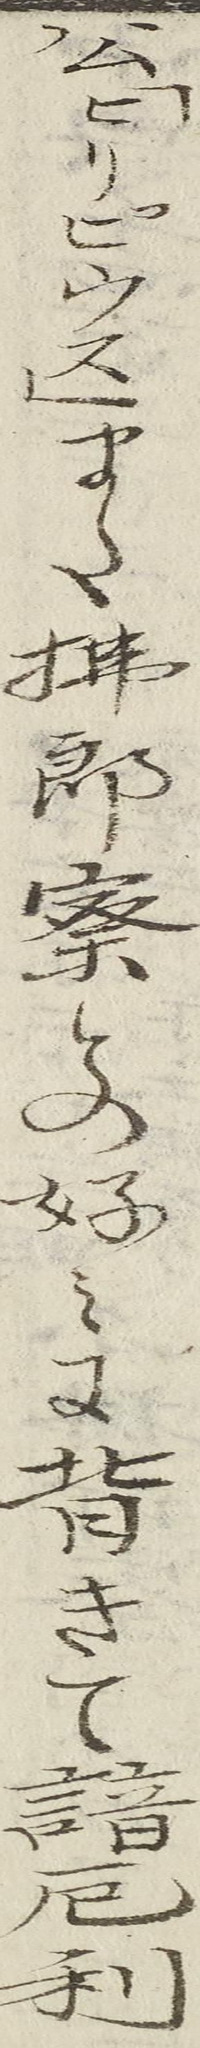公「ヒリピウス」また拂郎察との好ミに背きて諳厄利
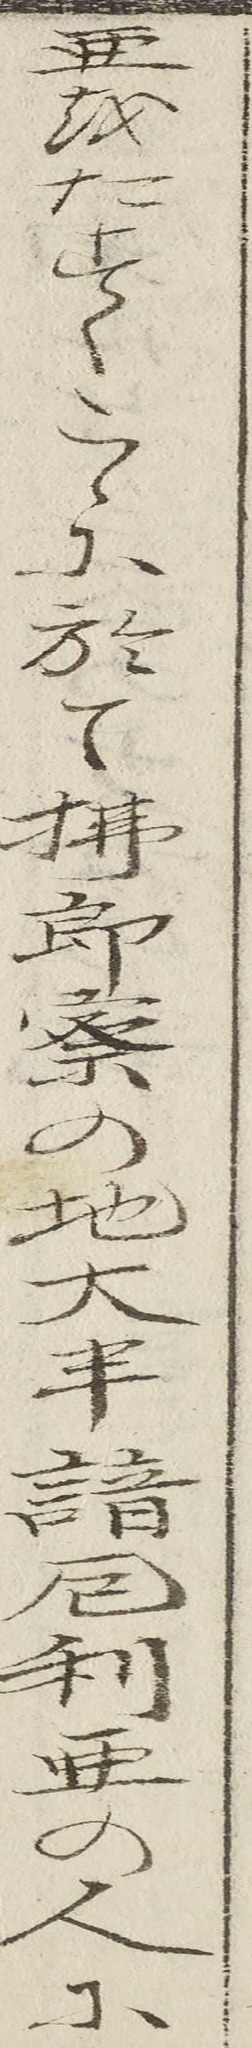亜をたすくこゝに於て拂郎察の地大半諳厄利亜の人に
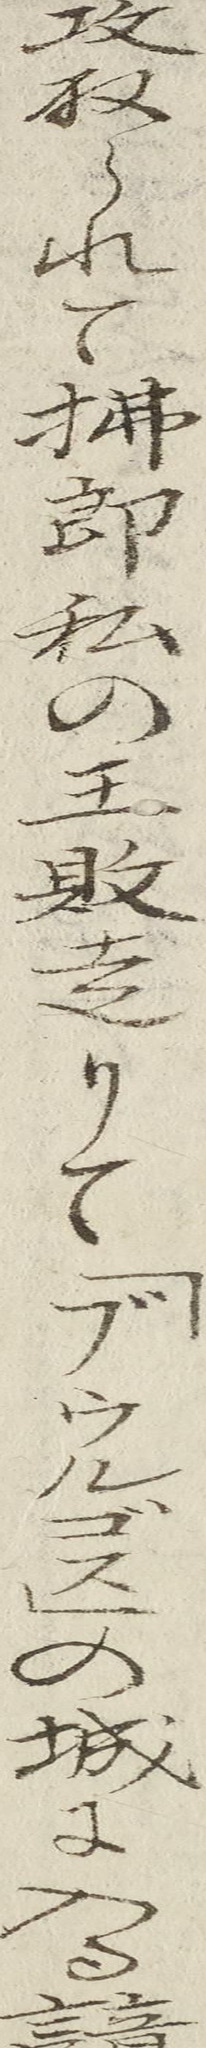攻取られて拂郎私の王敗走りて「ブウルゴス」の城に入る諳
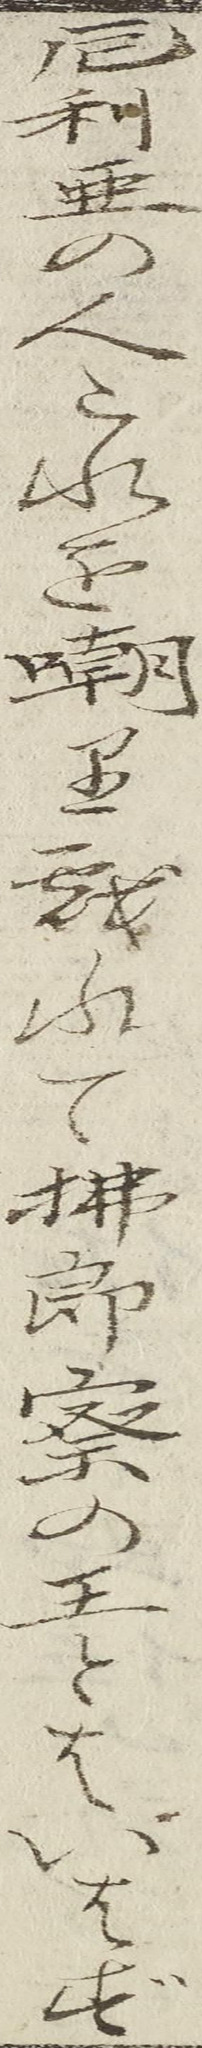厄利亜の人これを嘲り戯れて拂郎察の王とはいはず
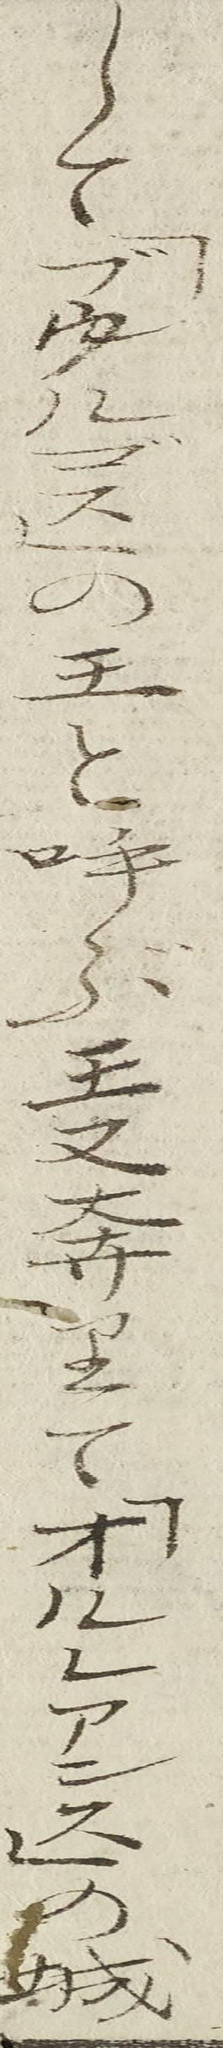して「ブウルゴス」の王と呼ふ王又奔りて「オルレアンス」の城
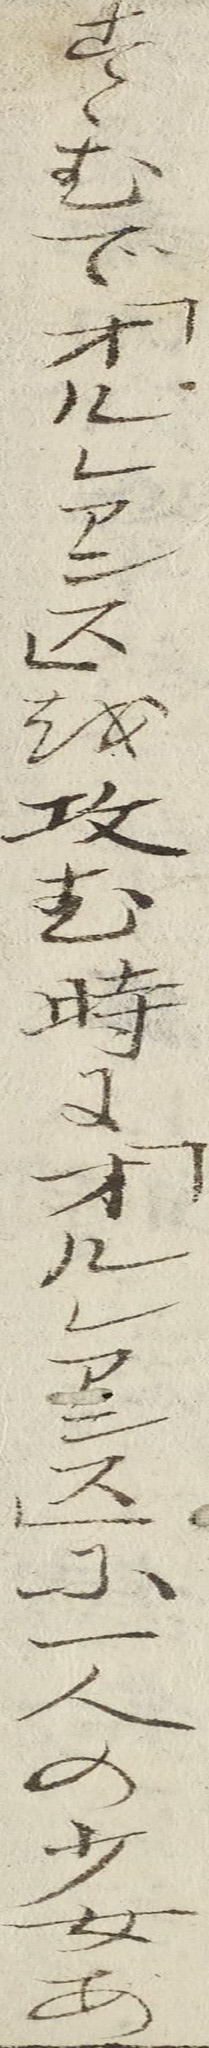すゝむで「オルレアンス」を攻む時に「オルレアンス」に一人の少女あ
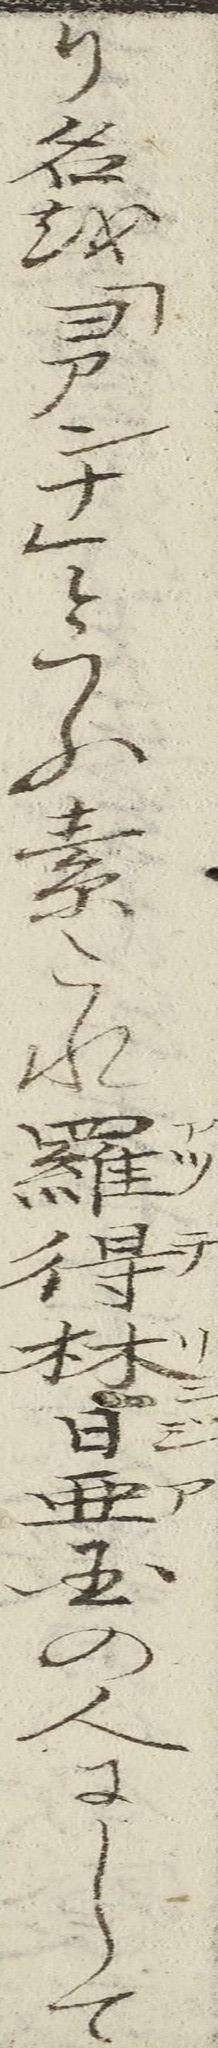り名を「ヨアンナ」といふ素これ羅得林日亜国の人にして
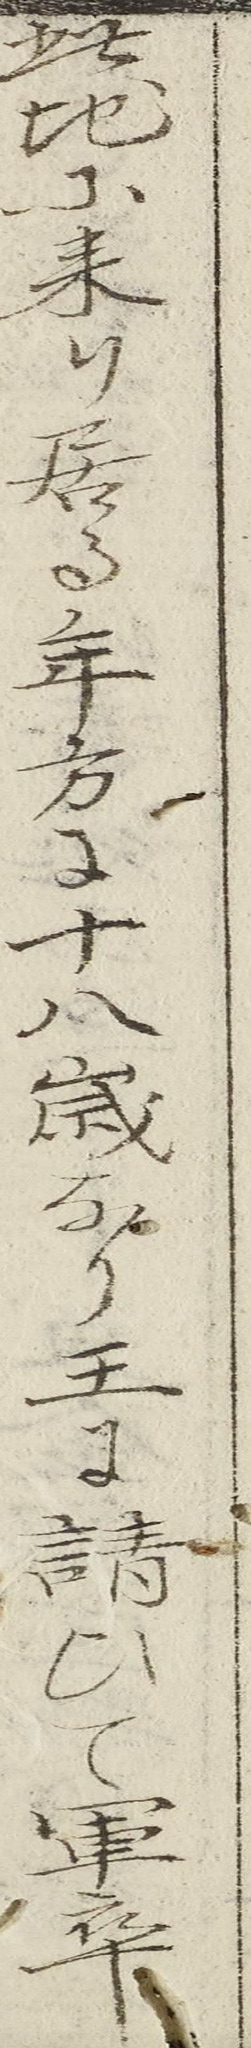此地に来り居る年方に十八歳なり王に請ひて軍卒
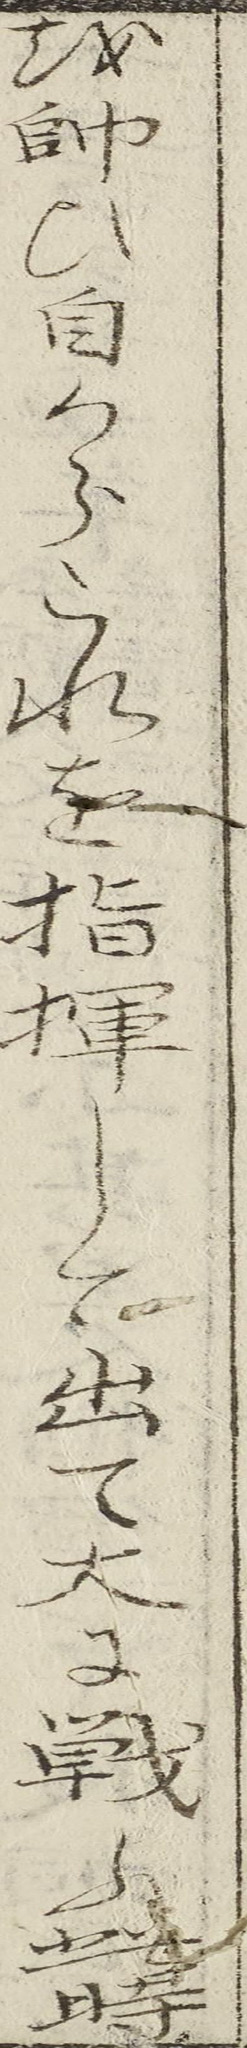を師ひ自からこれを指揮して出て大に戦ふ此時
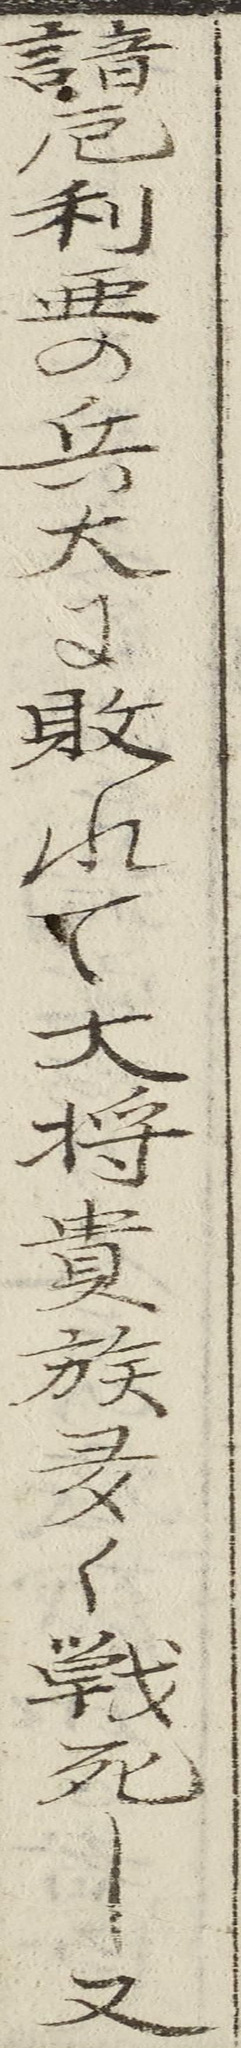諳厄利亜の兵大に敗れて大将貴族多く戦死し又
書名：西洋雜記　乾
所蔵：東京大学地震研究所図書室 Earthquake Research Institute Library, The University of Tokyo, JAPAN
